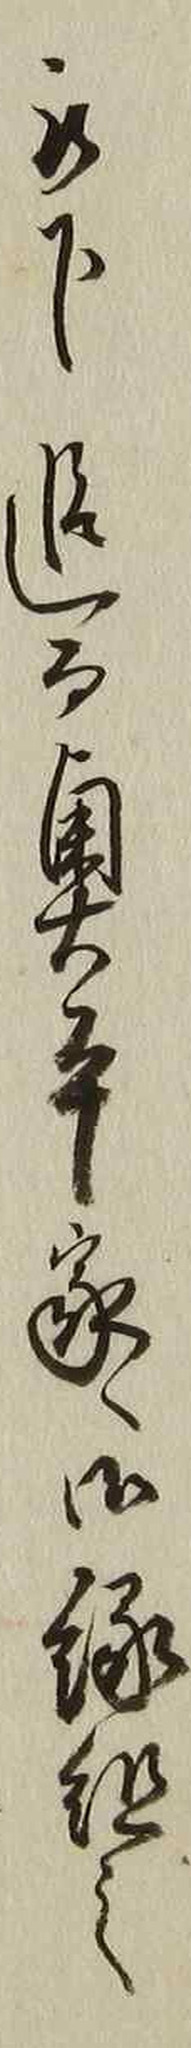被下追而奥平家へ縁組之
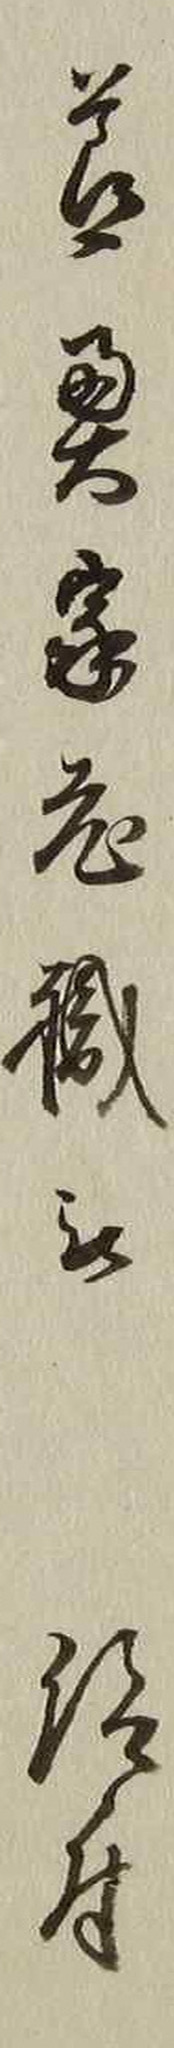節奥家老職被仰付
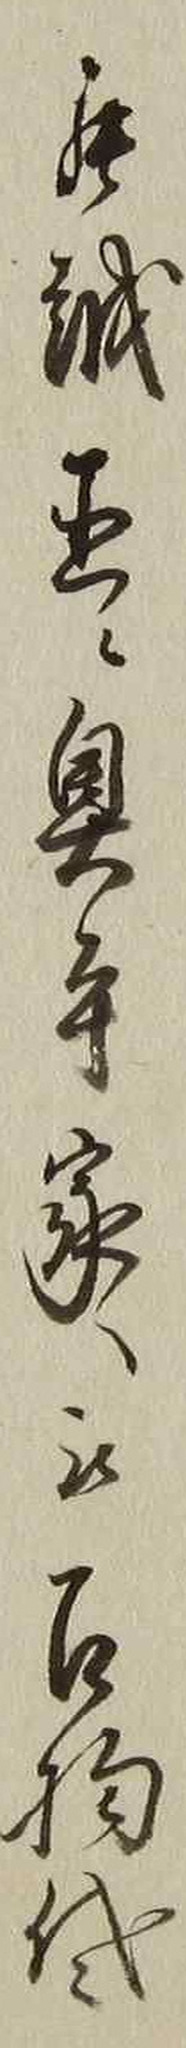罷越直ニ奥平家へ被召拘代々
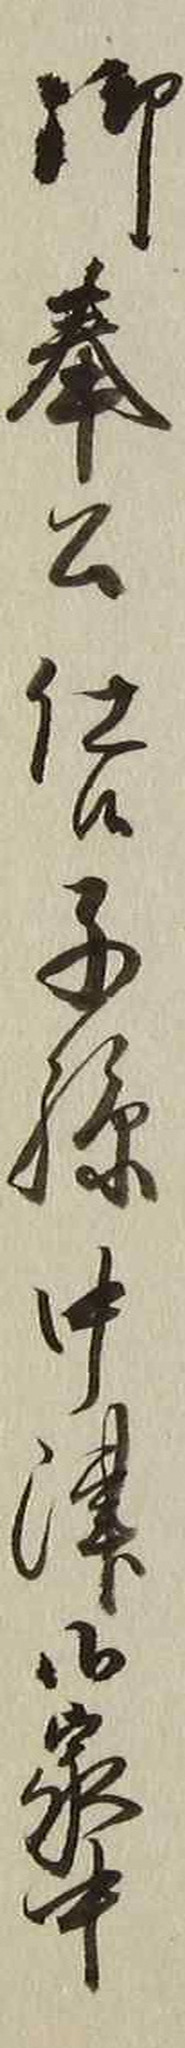御奉公仕候子孫中津御家中
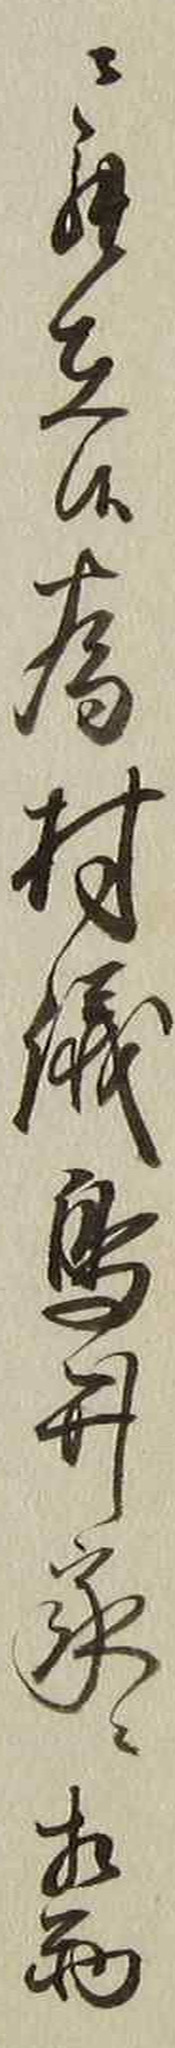ニ罷在候為村儀鳥井家ニ相勤
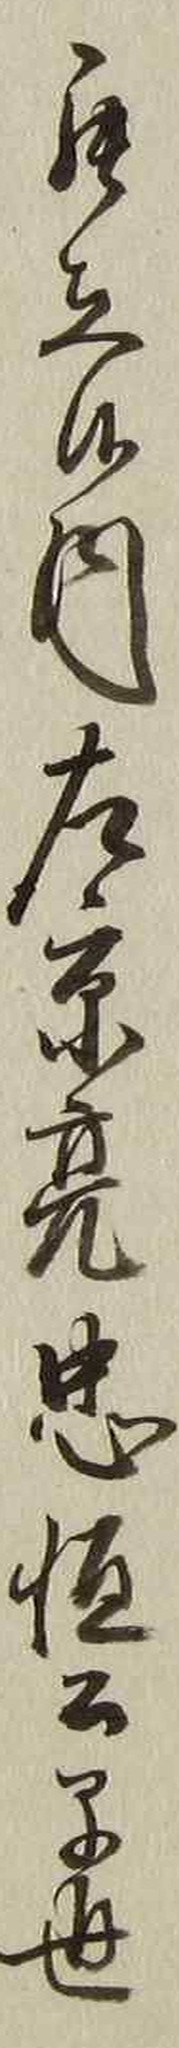ニ罷在候内左京亮忠恒公早世
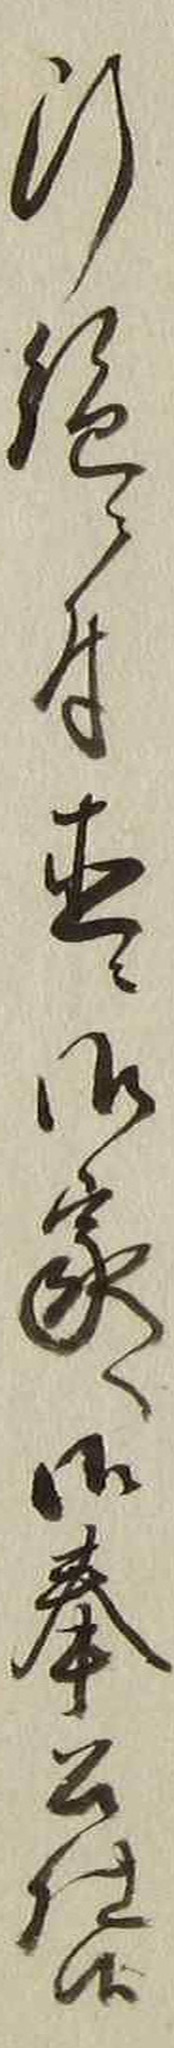断絶ニ付直ニ御家へ御奉公仕候
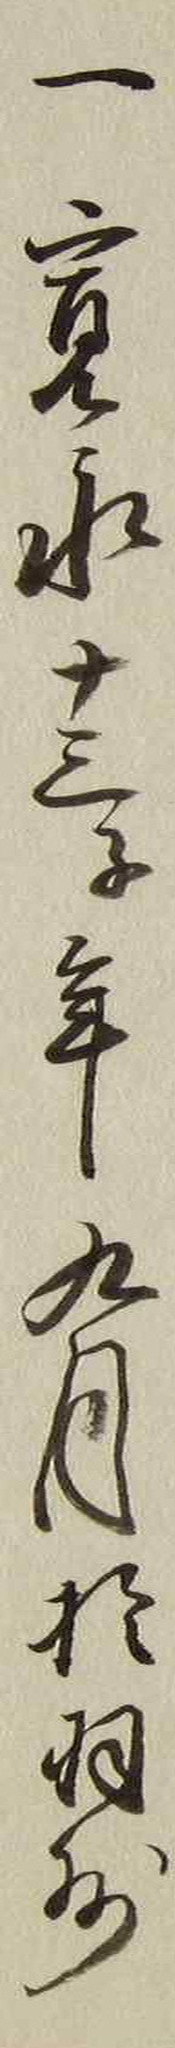一寛永十三子年九月於羽州
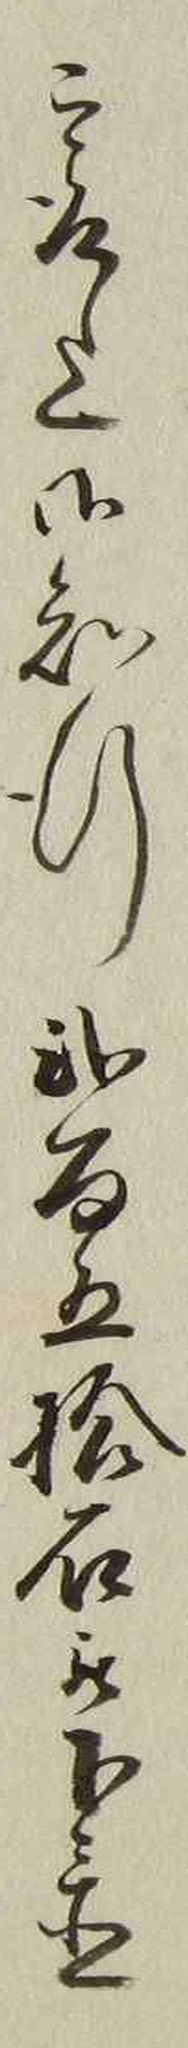最上御知行弐百五拾石被下置
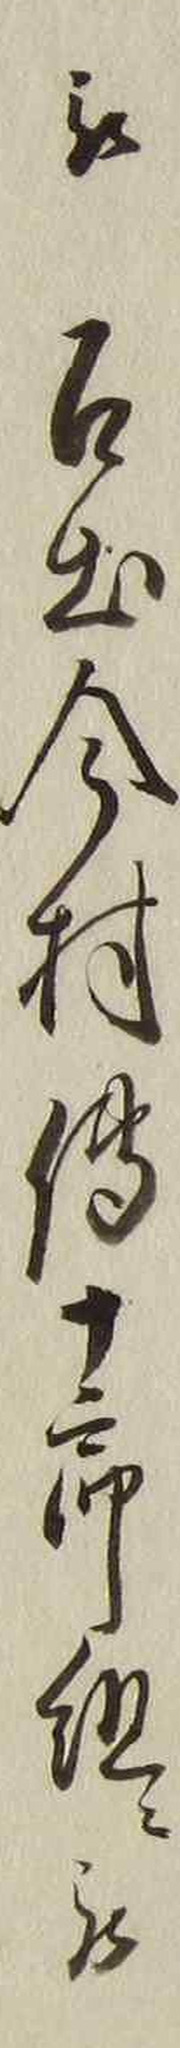被召出今村伝十郎組ニ被
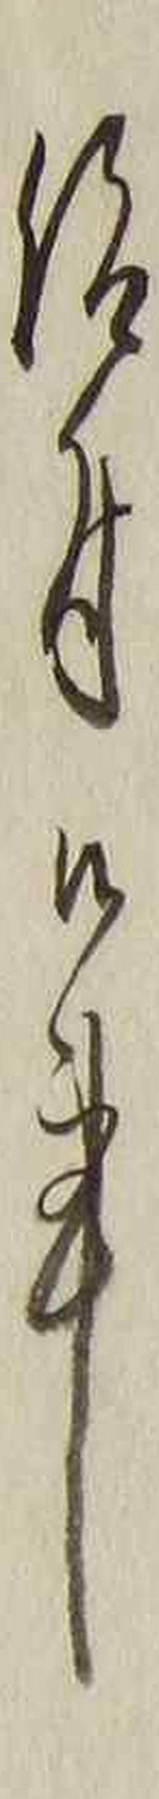仰付候事

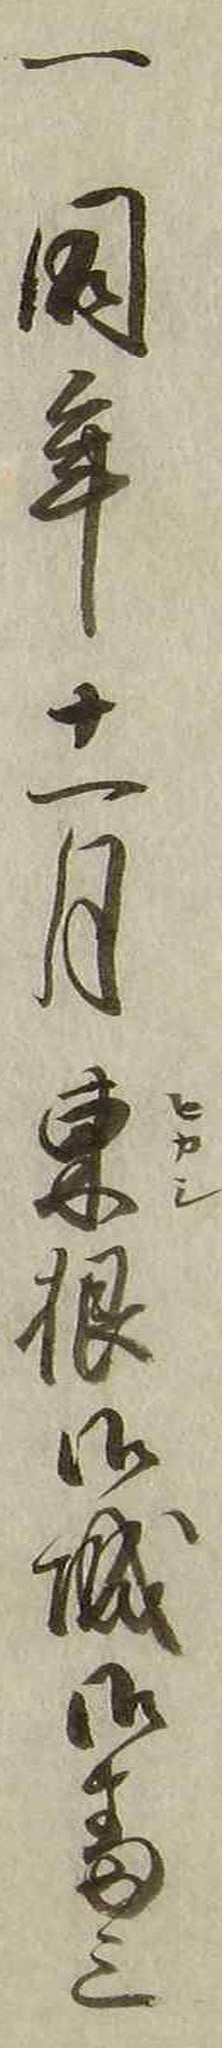一同年十一月東根御城御番三
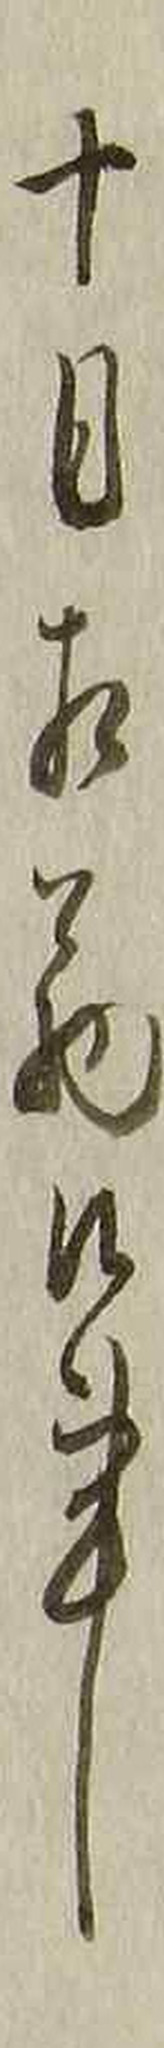十日相勤候事
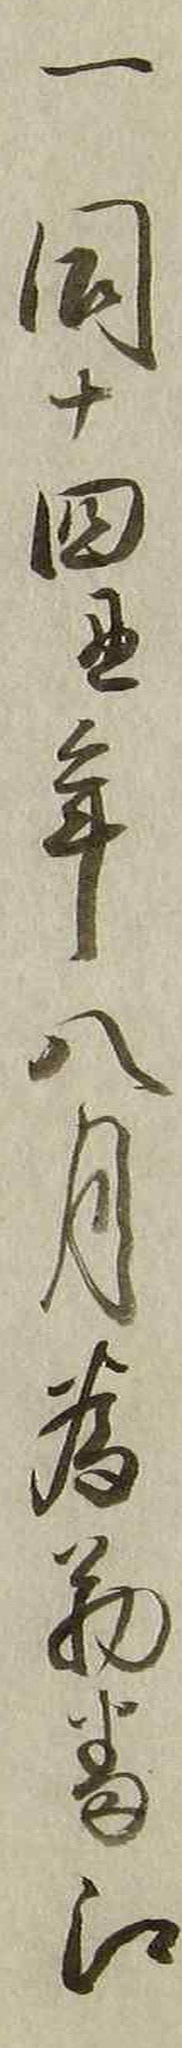一同十四丑年八月為勤番江
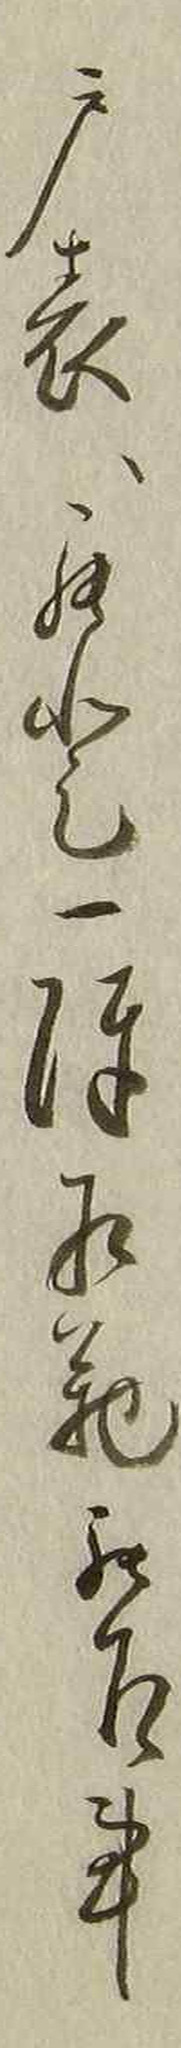戸表へ罷登一陣相勤罷下候事
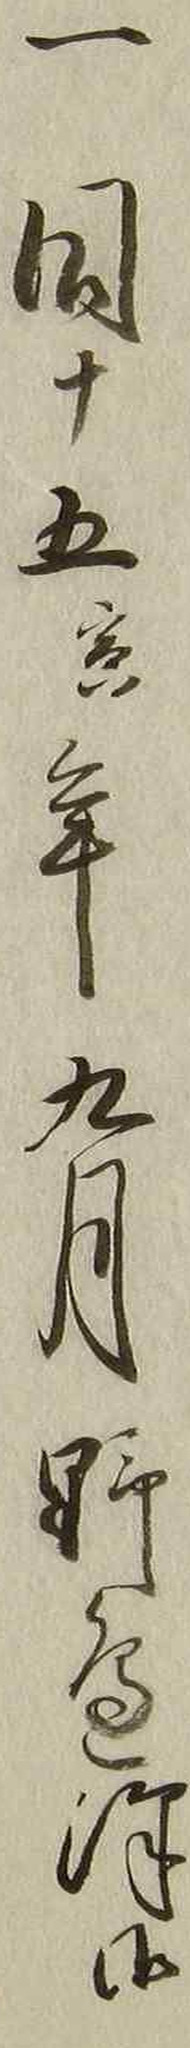一同十五寅年九月野辺沢御
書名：諸士系譜　巻之18　い之部18
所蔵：会津若松市立会津図書館
